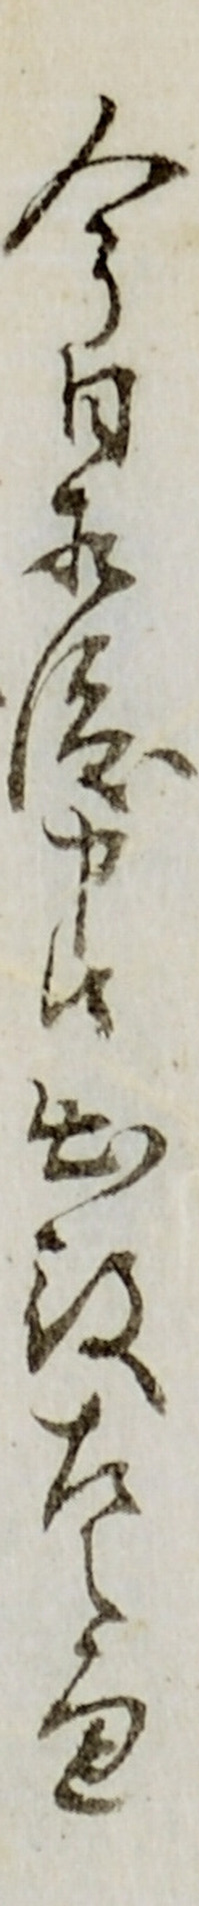今日相渡申候出役左之通
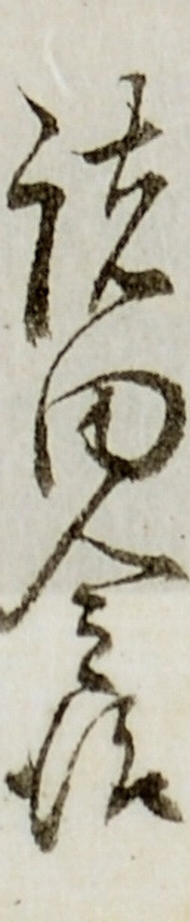諸田金治
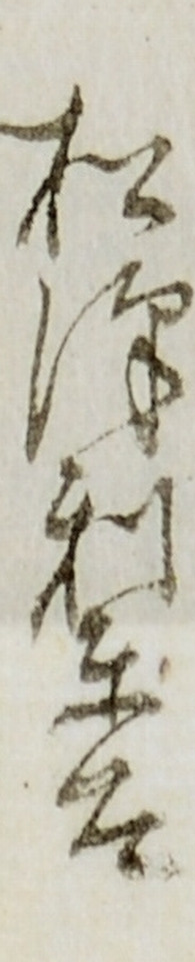松沢利東太
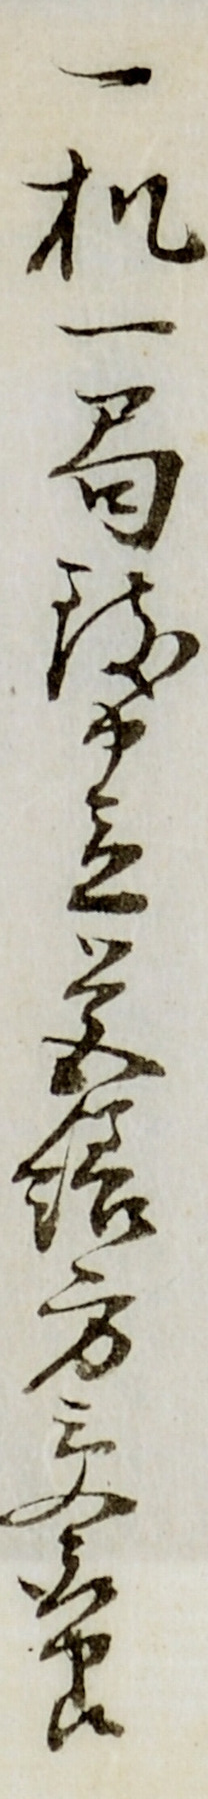一机一局致申立営繕方受取申候
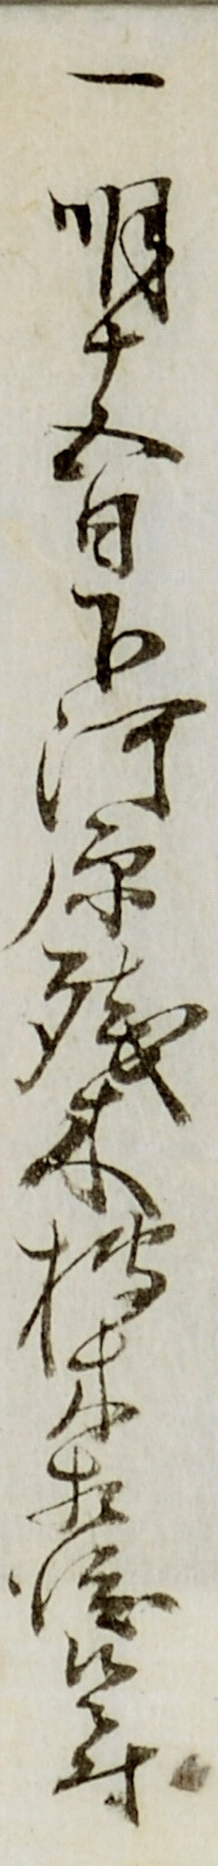一明十五日下河原残木榑木相渡候に付
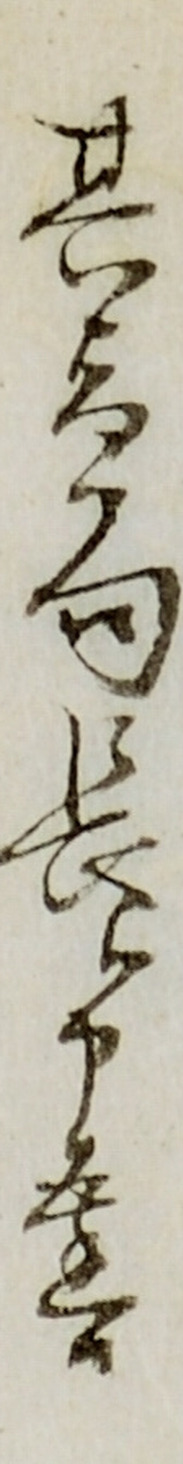其旨局長え申達候
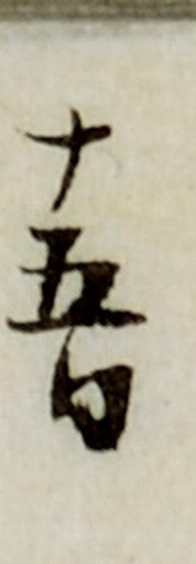十五日
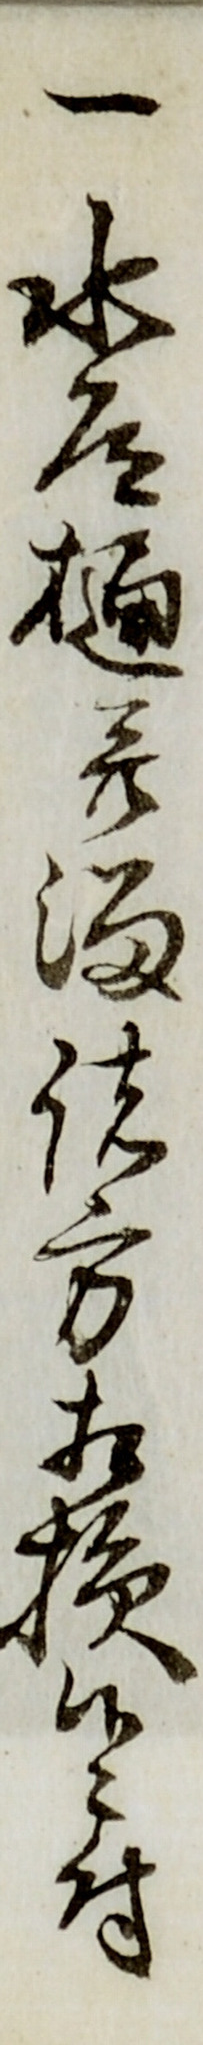一水道樋幷溜諸方相損候に付
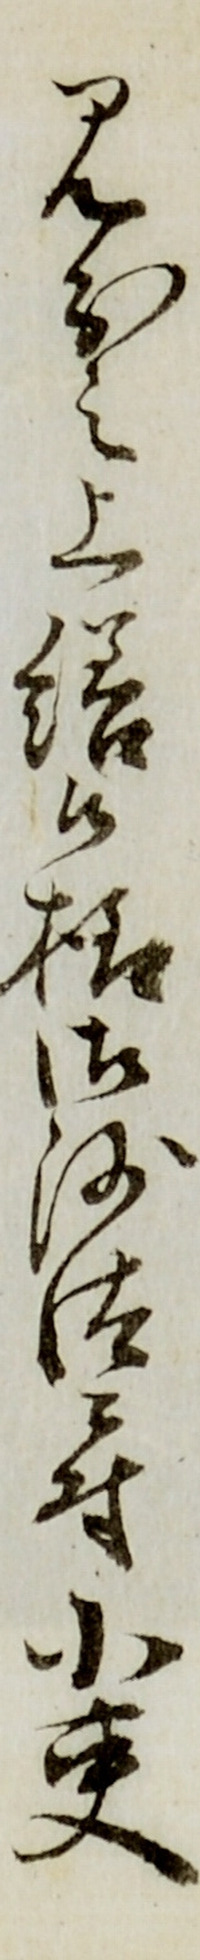見分之上繕候様御沙汰に付小使
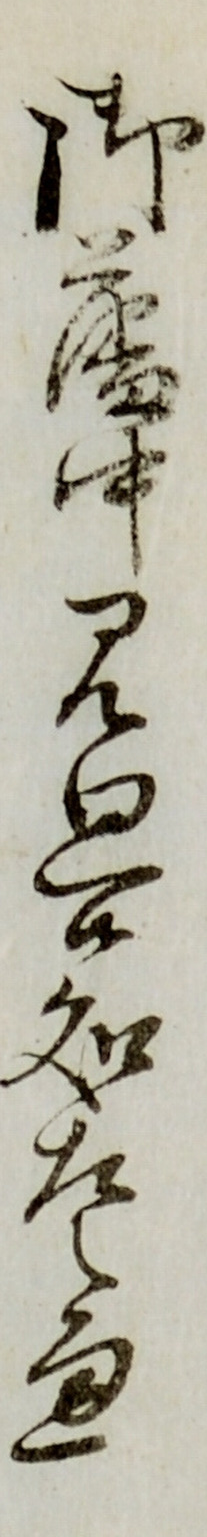御藩中見廻候処左之通
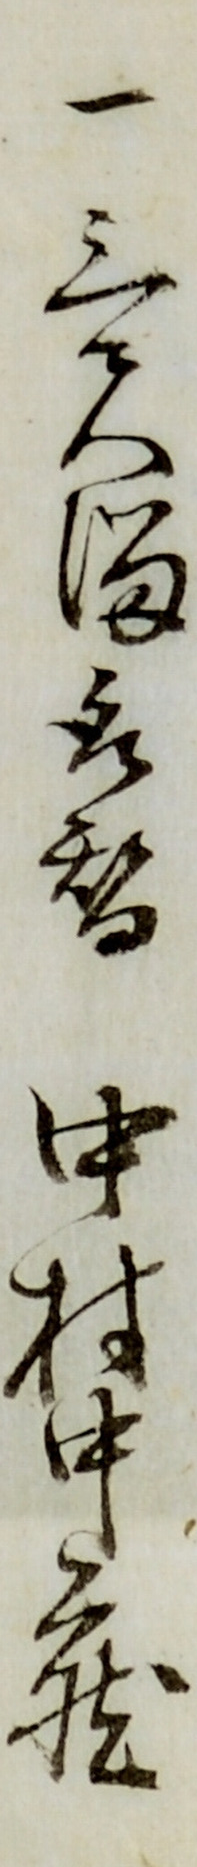一三尺溜取替中村中蔵

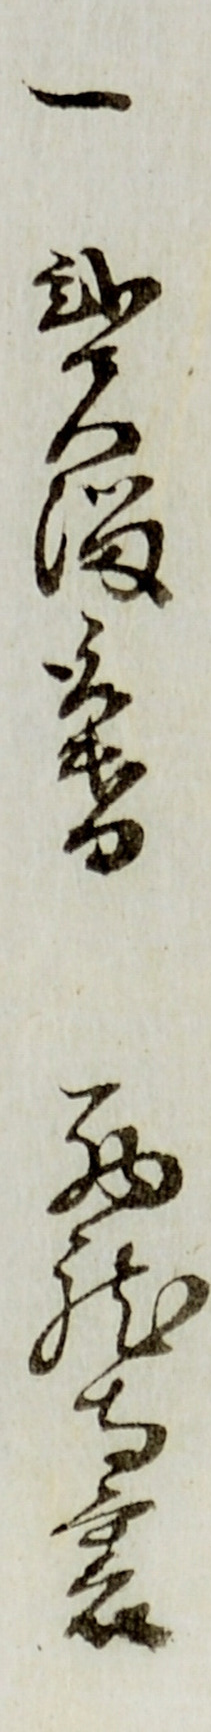一弐尺溜取替西龍寺裏
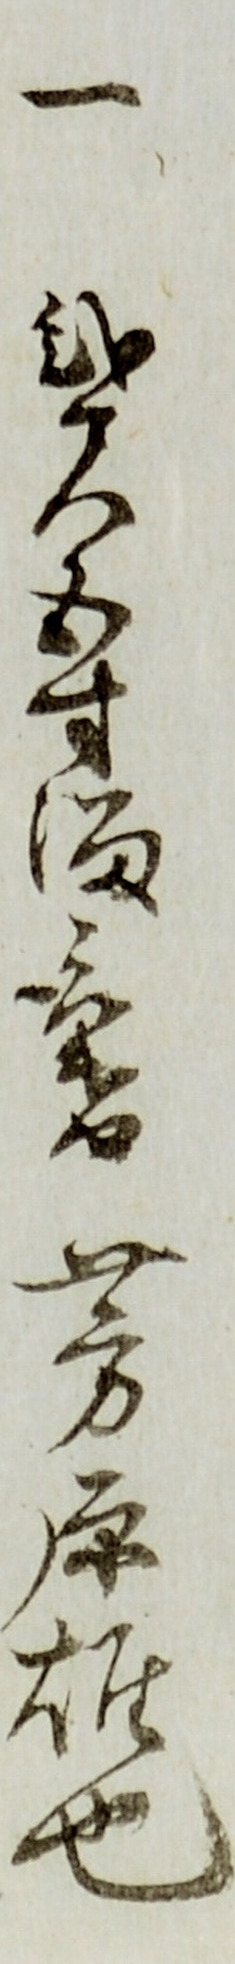一弐尺五寸溜取替芳原雄也
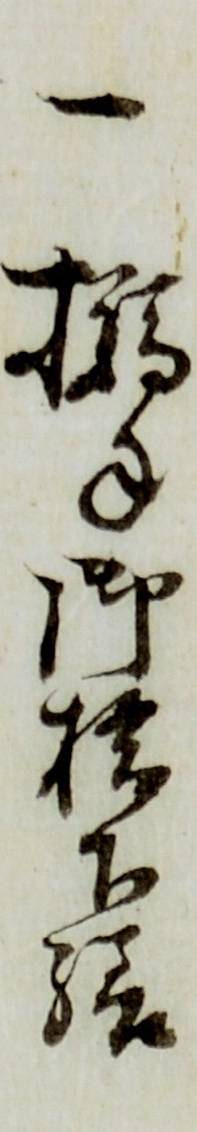一搦手御橋下繕
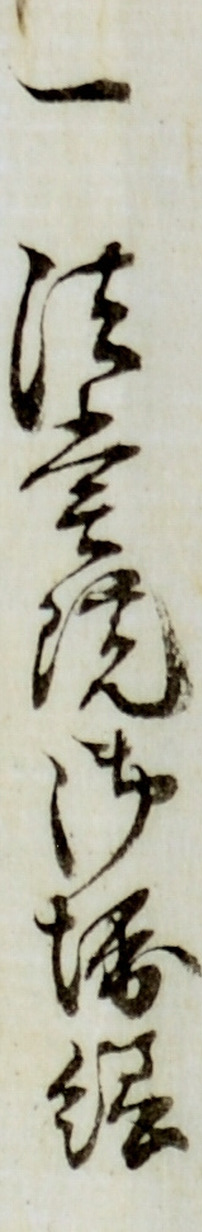一法堂印御堀繕

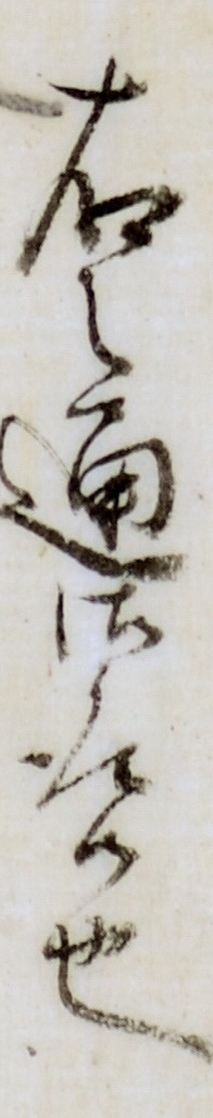右之通御座候也
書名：山林方諸事御用留
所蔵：伊那市立高遠町図書館・合同会社AMANE
